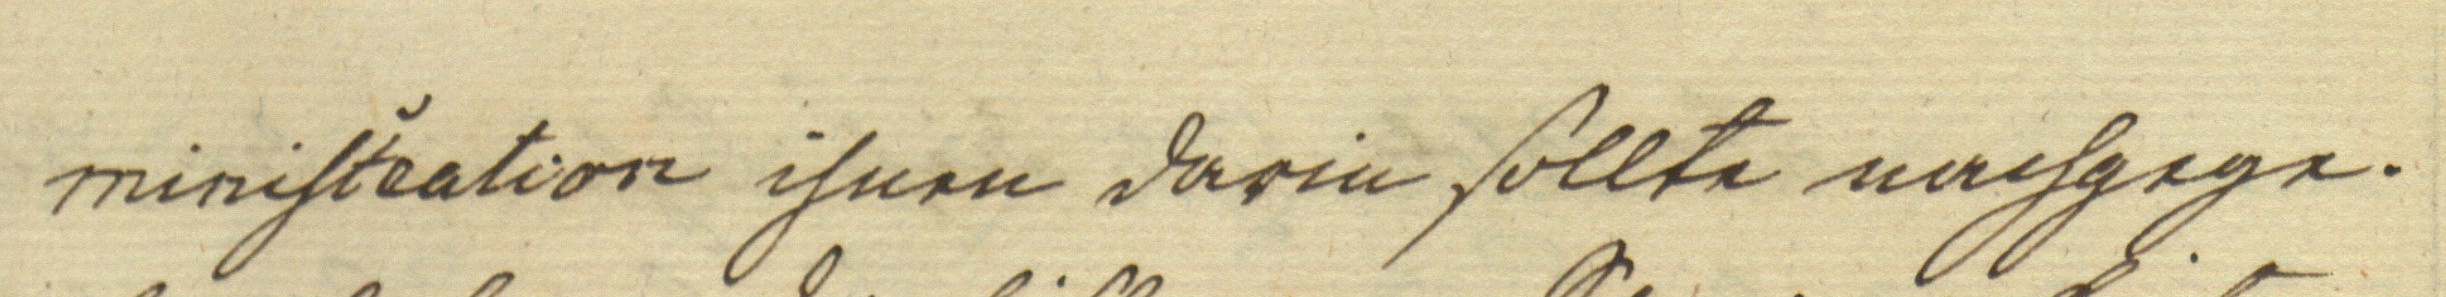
ministration ihnen darin sollte nachgege¬
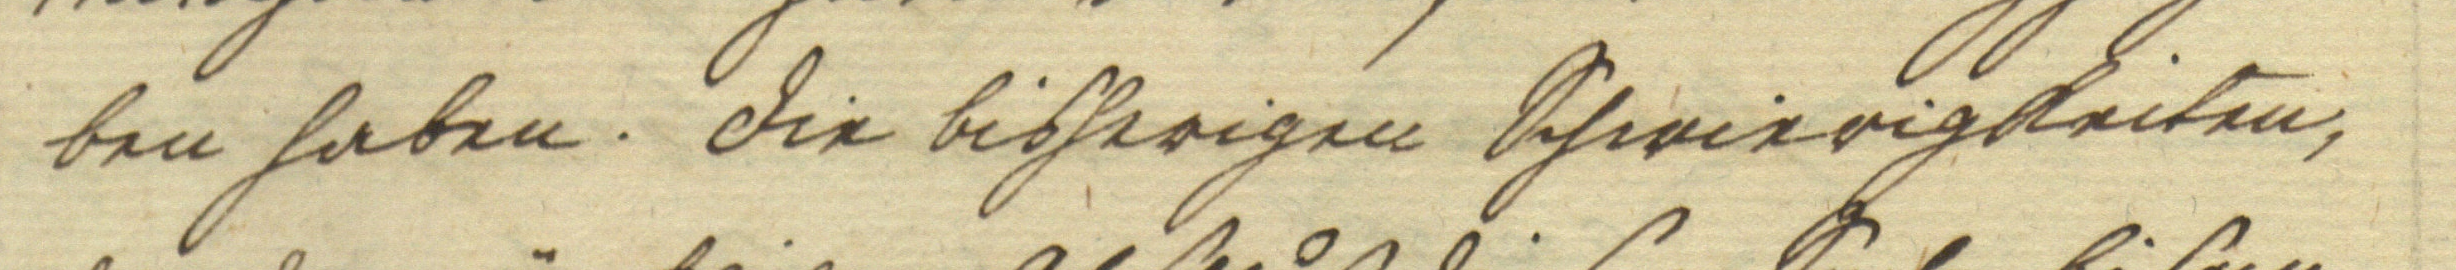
ben haben. Die bisherigen Schwierigkeiten,
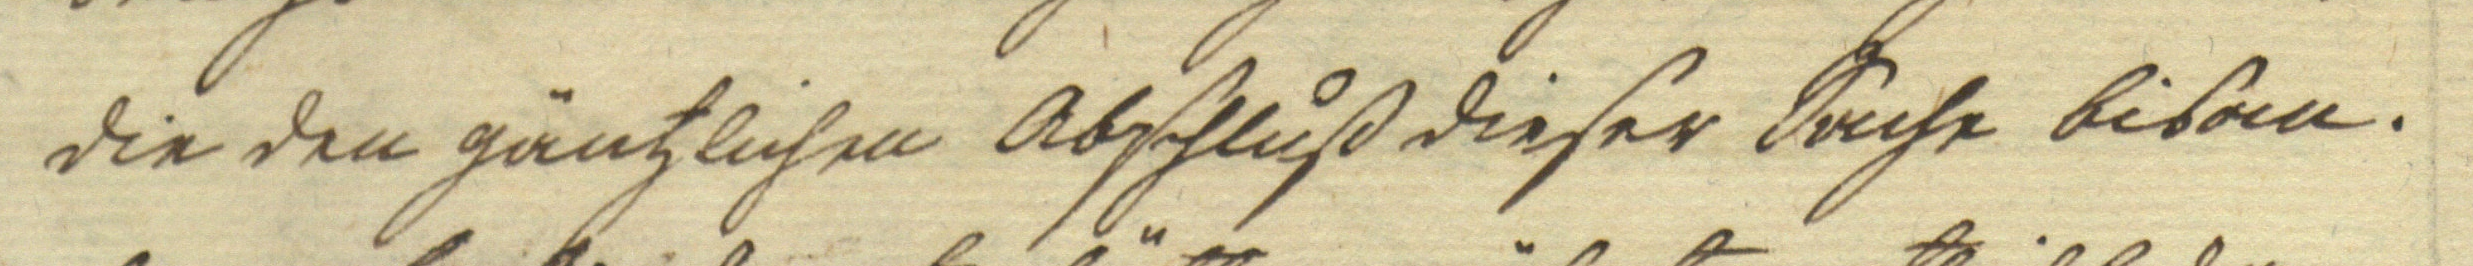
die den gäntzlichen Abschluß dieser Sache bisan¬
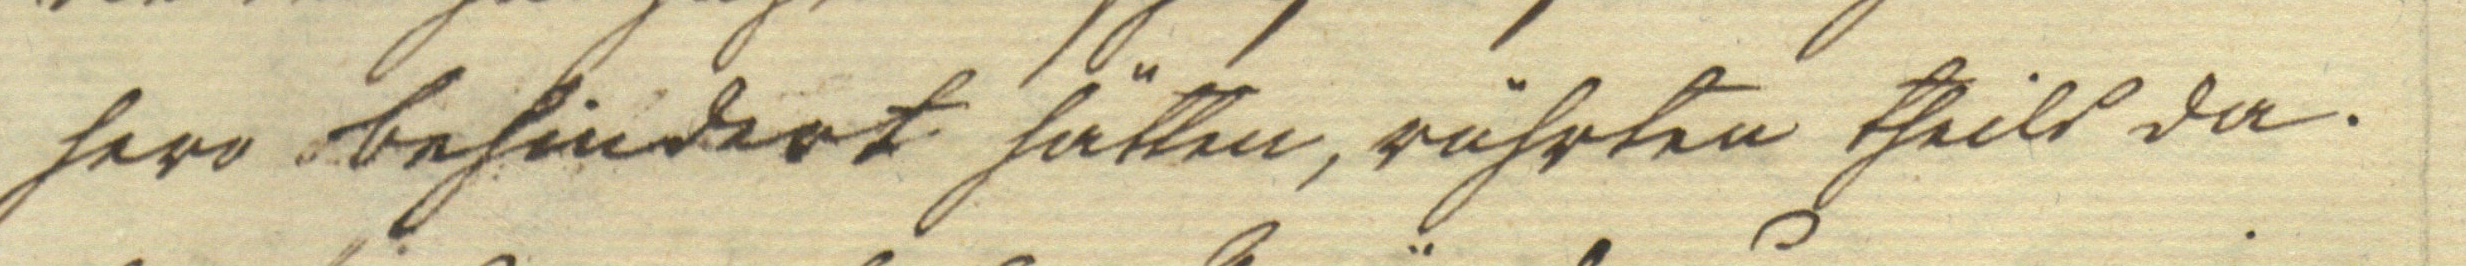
hero behindert hätten, rührten theils da¬
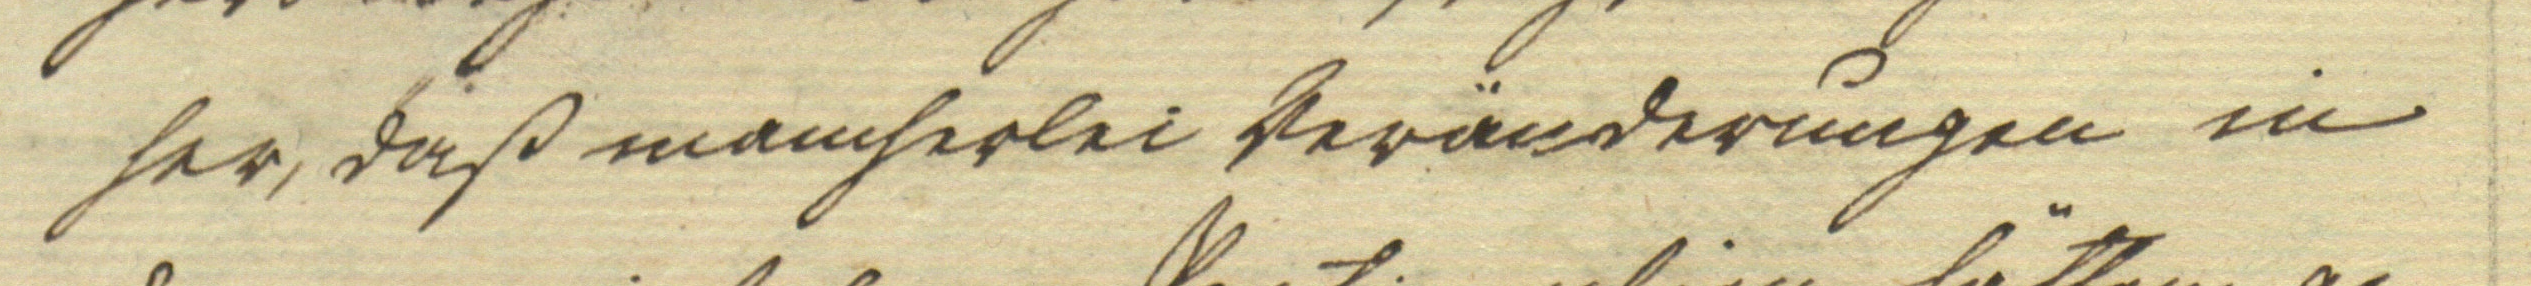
her, daß mancherlei Veränderungen in
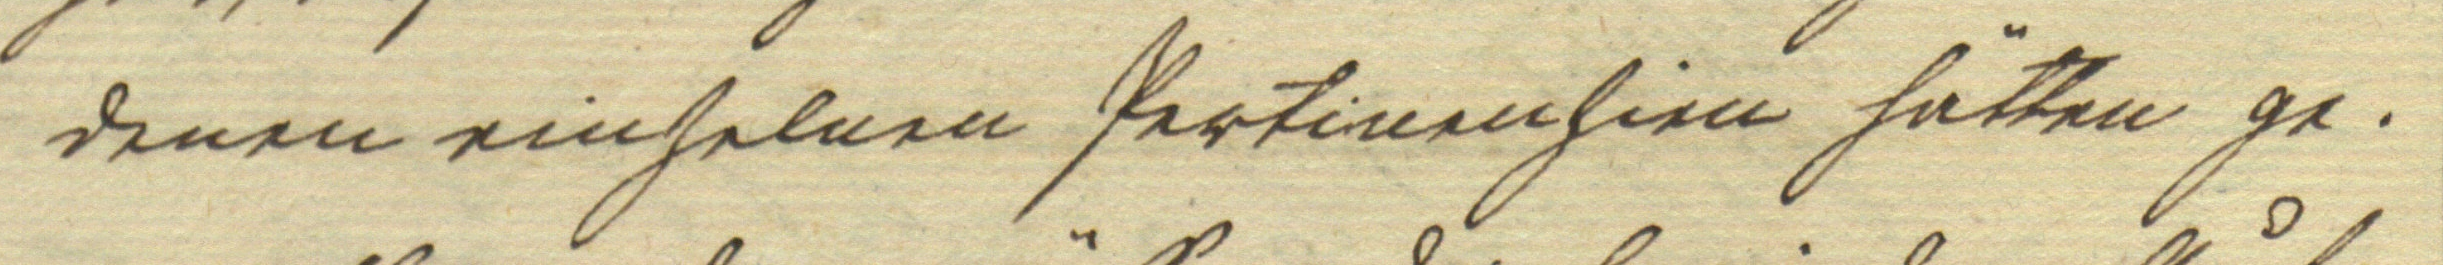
denen einzelnen Pertinenzien hätten ge¬
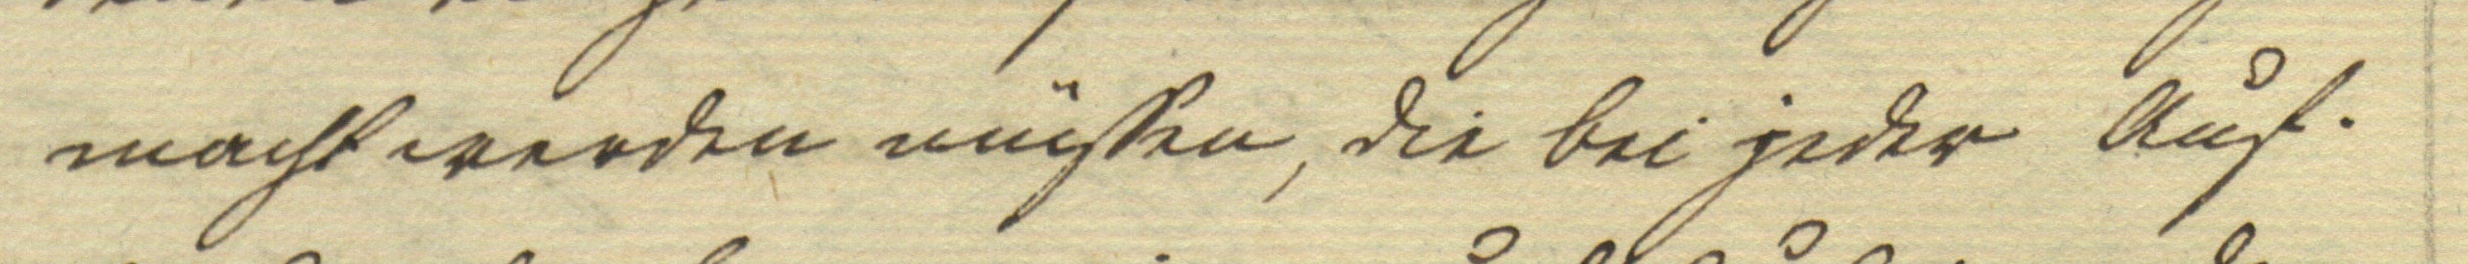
macht werden müssen, die bei jeder Auf¬
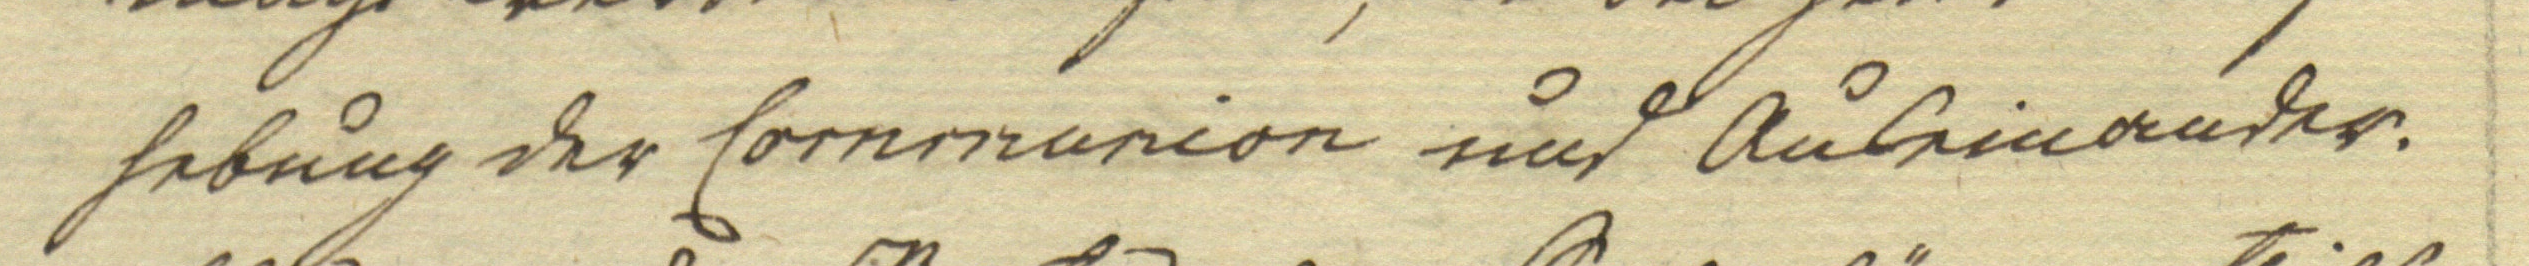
hebung der Communion und Auseinander¬
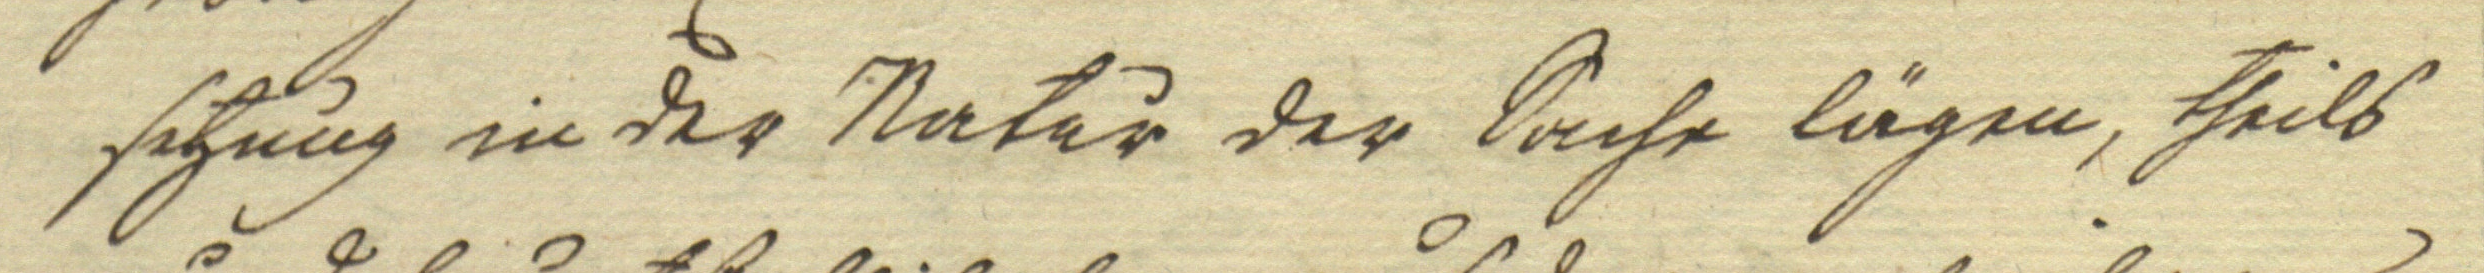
setzung in der Natur der Sache lägen, theils
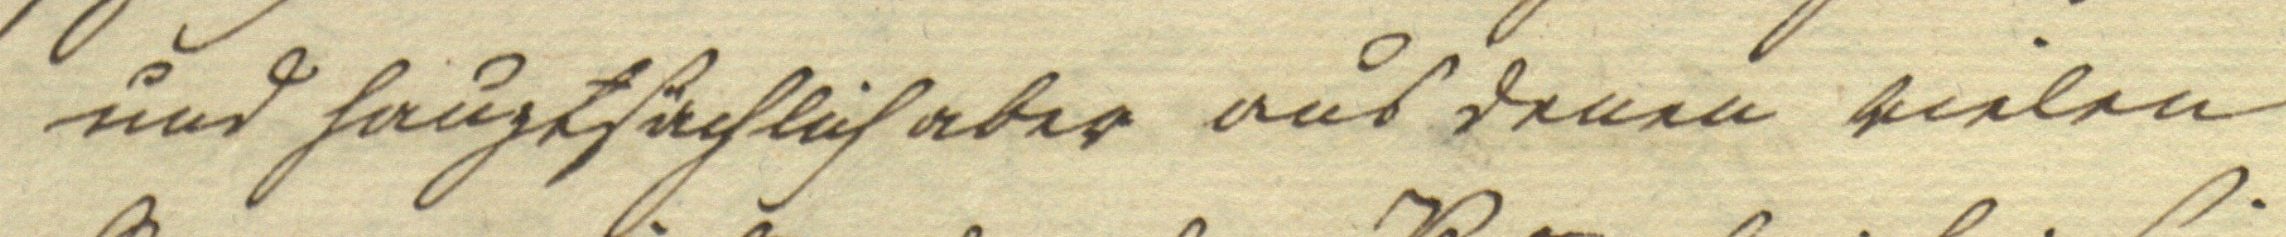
und hauptsächlich aber aus denen vielen
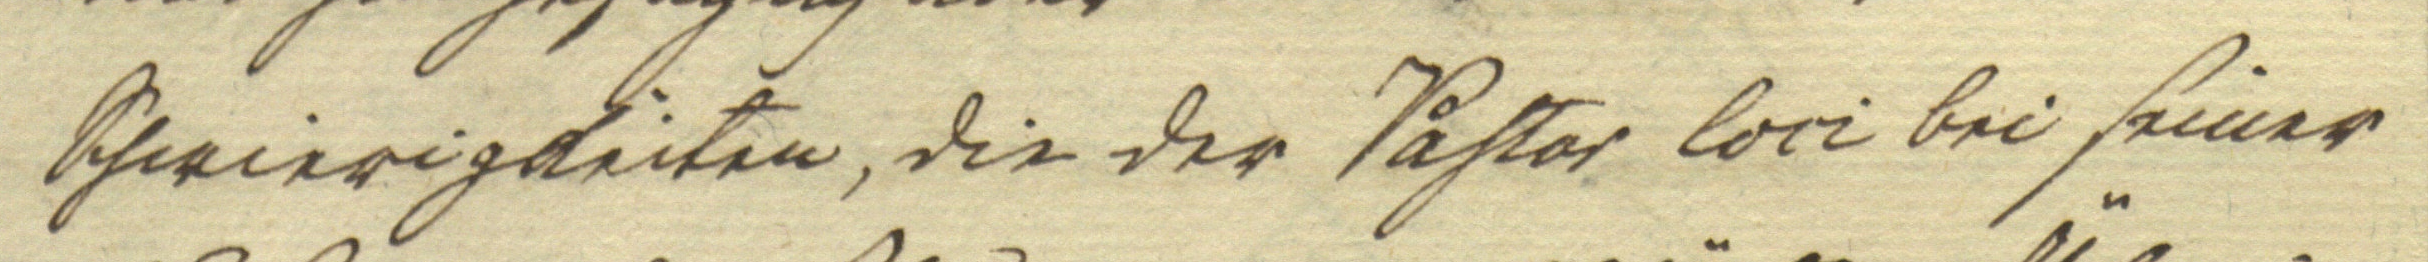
Schwierigkeiten, die der Pastor loci bei seiner
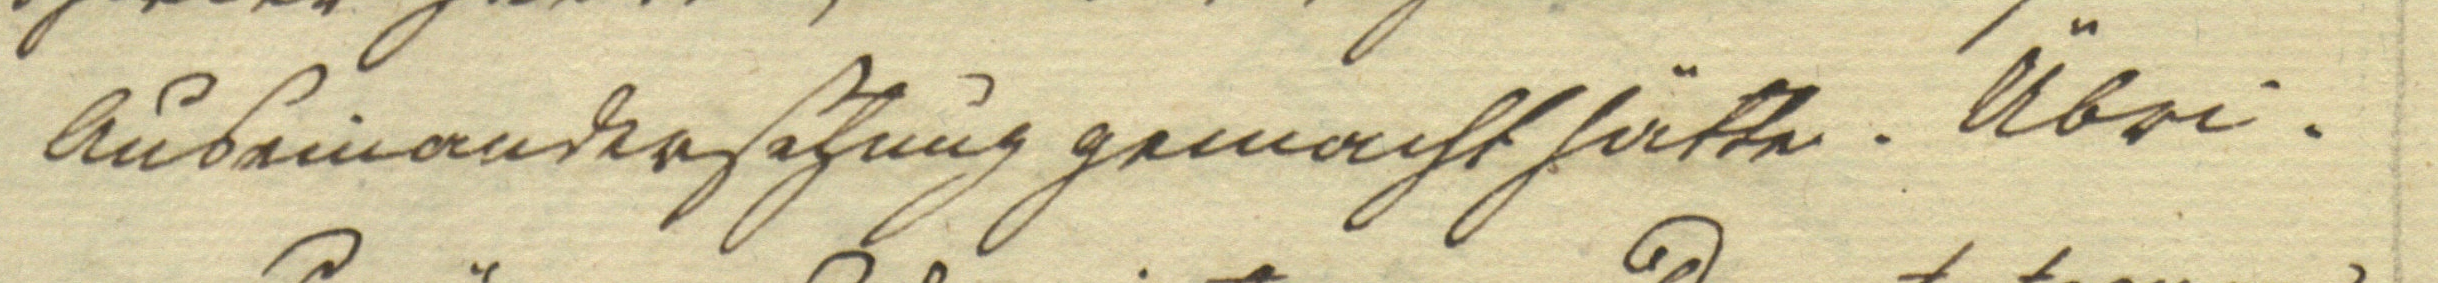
Auseinandersetzung gemacht hätte. Übri¬
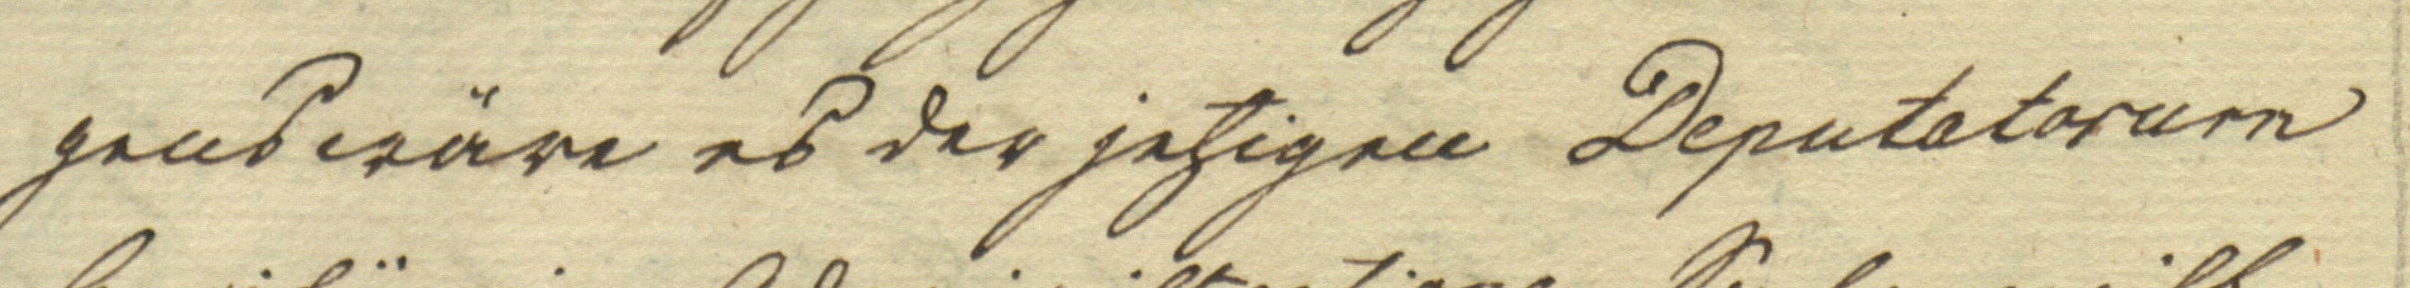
gens wäre es der jetzigen Deputatorum
